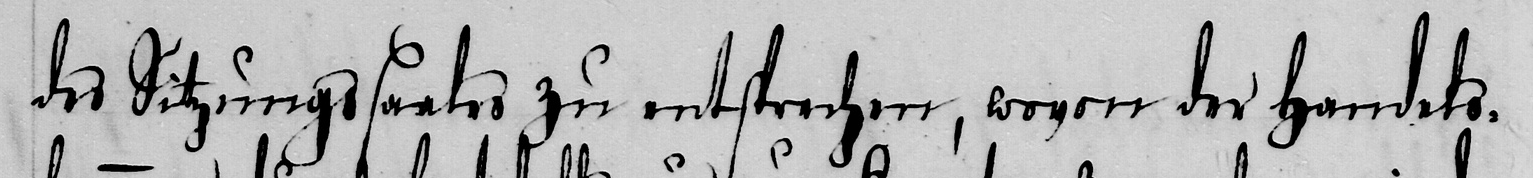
des Sitzungssaales zu entsprechen, wovon der Handels¬
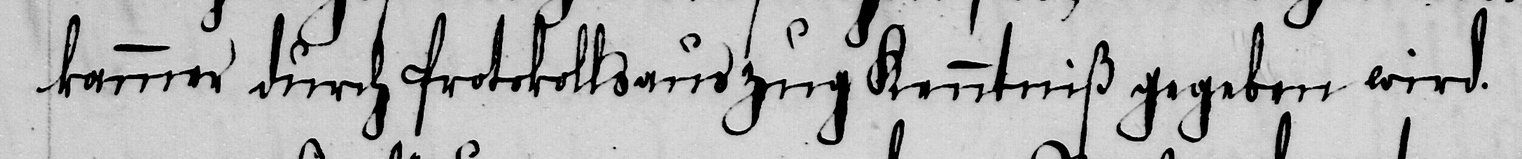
kammer durch Protokollsauszug Kenntniß gegeben wird.
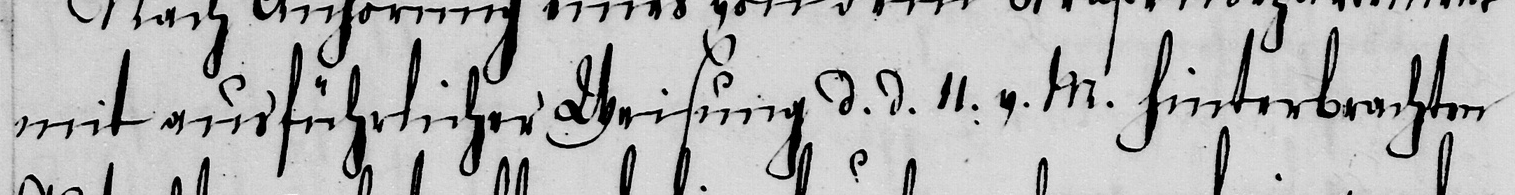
mit ausführlicher Weisung d. d. 11. v. M. hinterbrachten
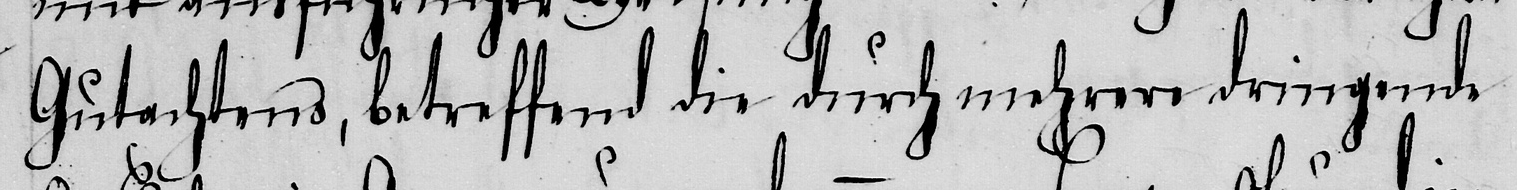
Gutachtens, betreffend die durch mehrere dringende
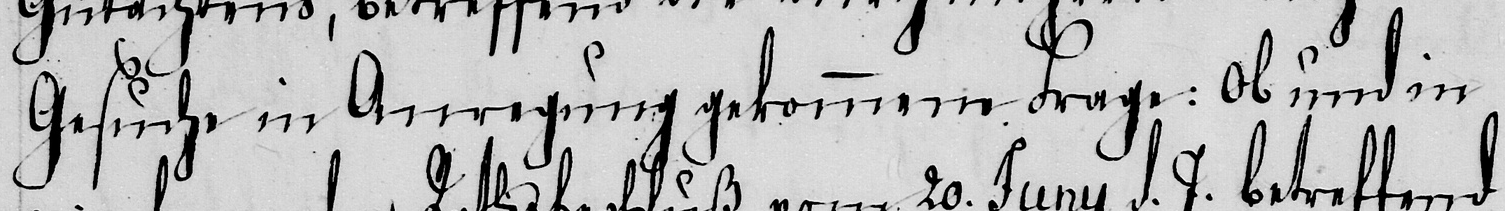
Gesuche in Anregung gekommene Frage: Ob und in
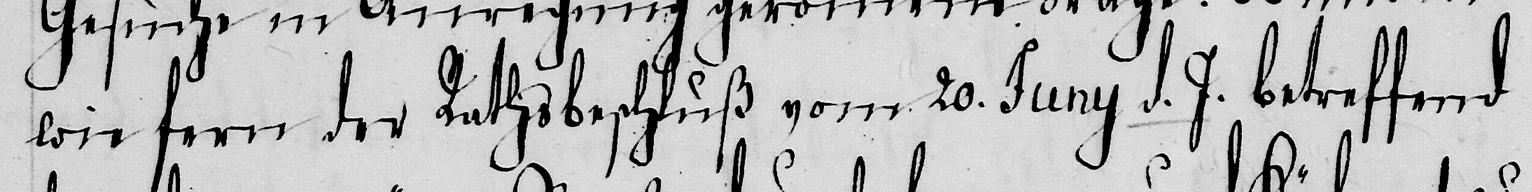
wie fern der Rathsbeschluß vom 20. Juny d. J. betreffend
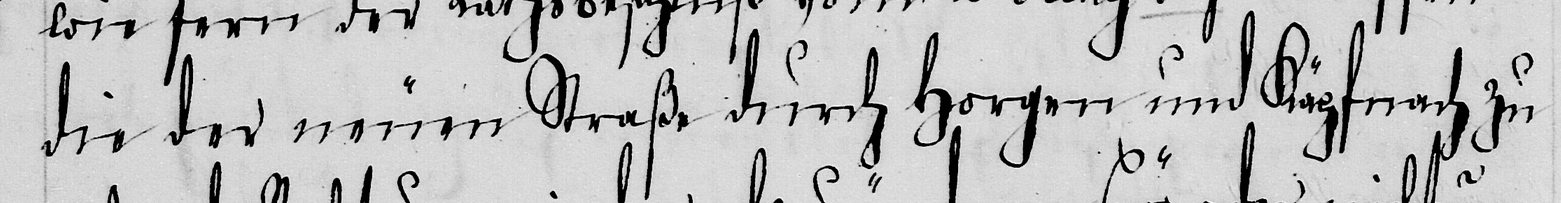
die der neuen Straße durch Horgen und Käpfnach zu
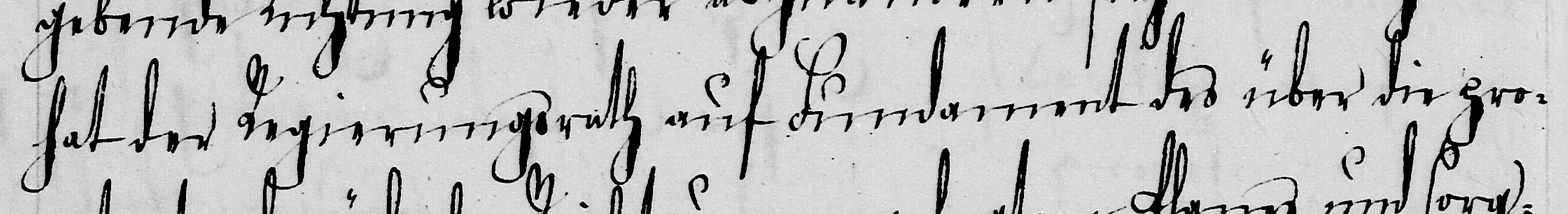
hat der Regierungsrath auf Fundament des über die pr¬
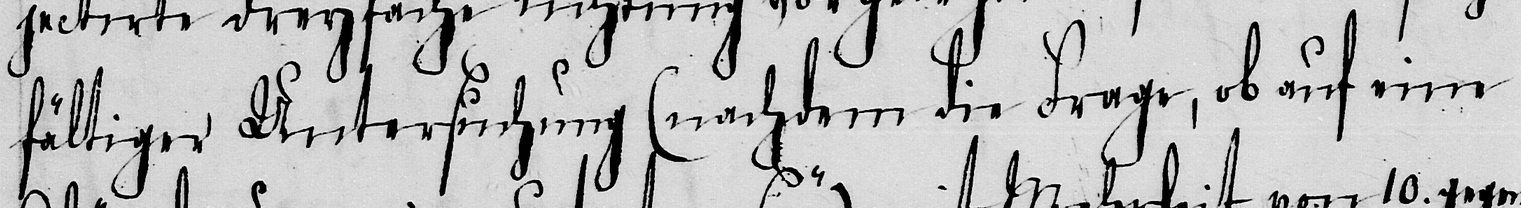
fältiger Untersuchung (nachdem die Frage, ob auf eine
